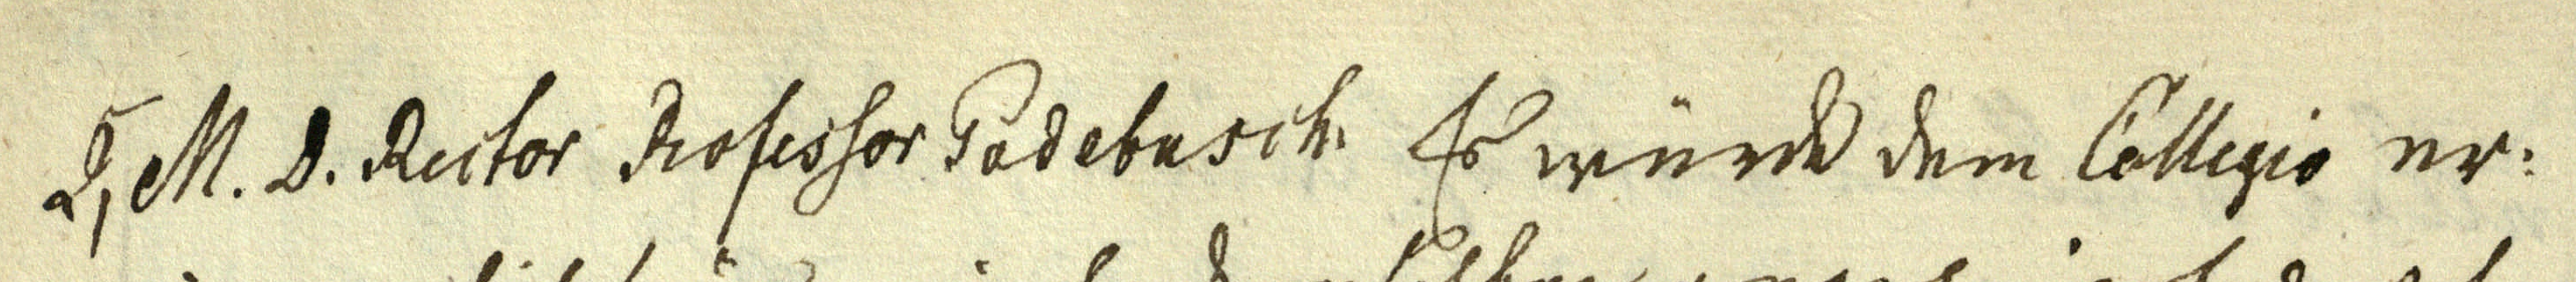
2, M. D. Rector Professor Gadebusch. Es würde dem Collegio er¬
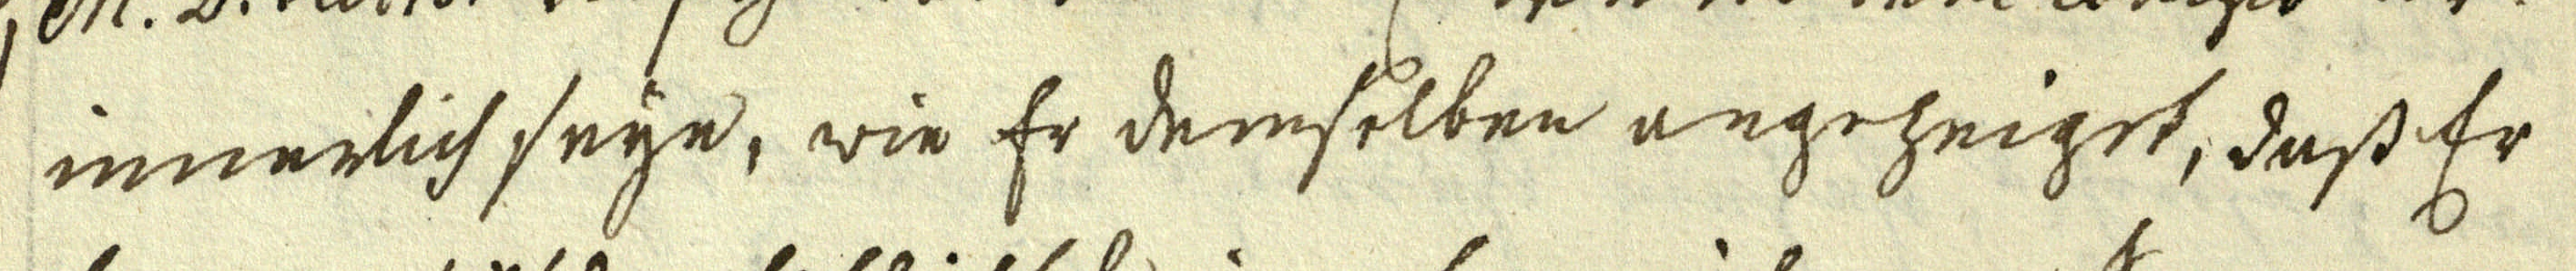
innerlich seÿn, wie Er demselben angezeiget, daß Er
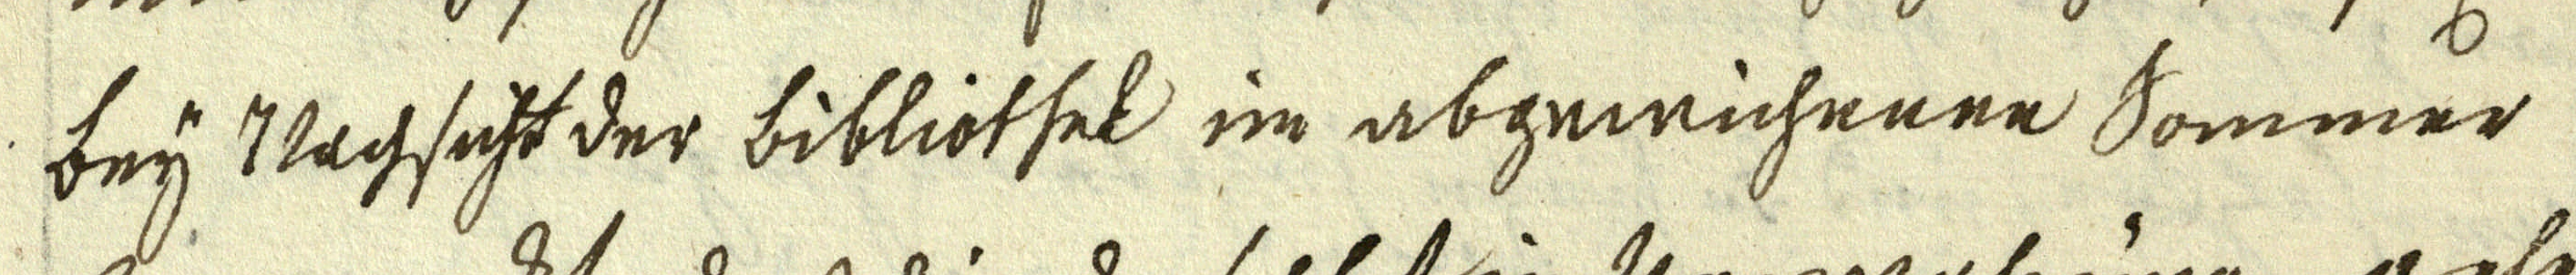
beÿ Nachsicht der Bibliothek im abgewichenen Sommer
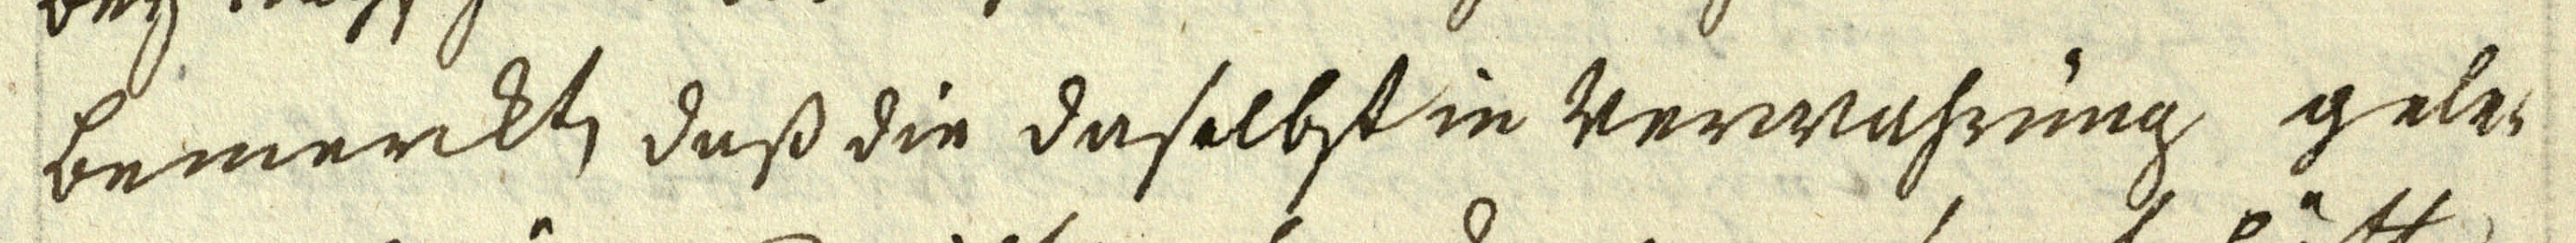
bemerckt, daß die daselbst in Verwahrung gele¬
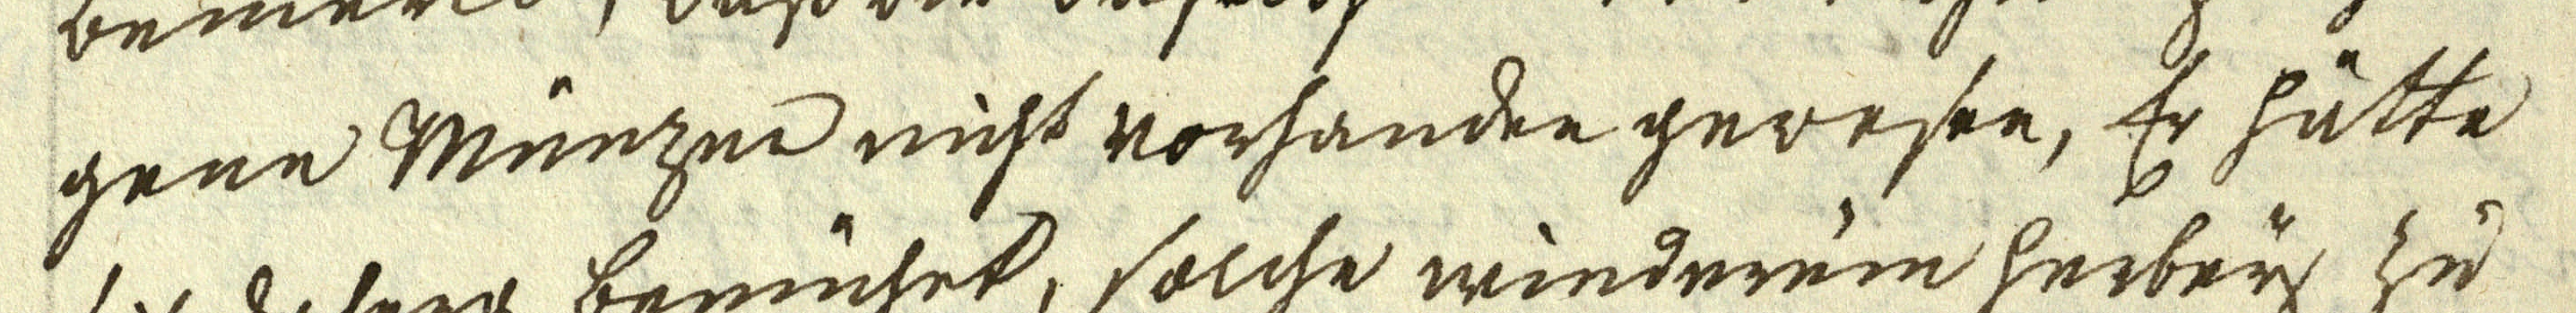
gene Münzen nicht vorhanden gewesen, Er hätte
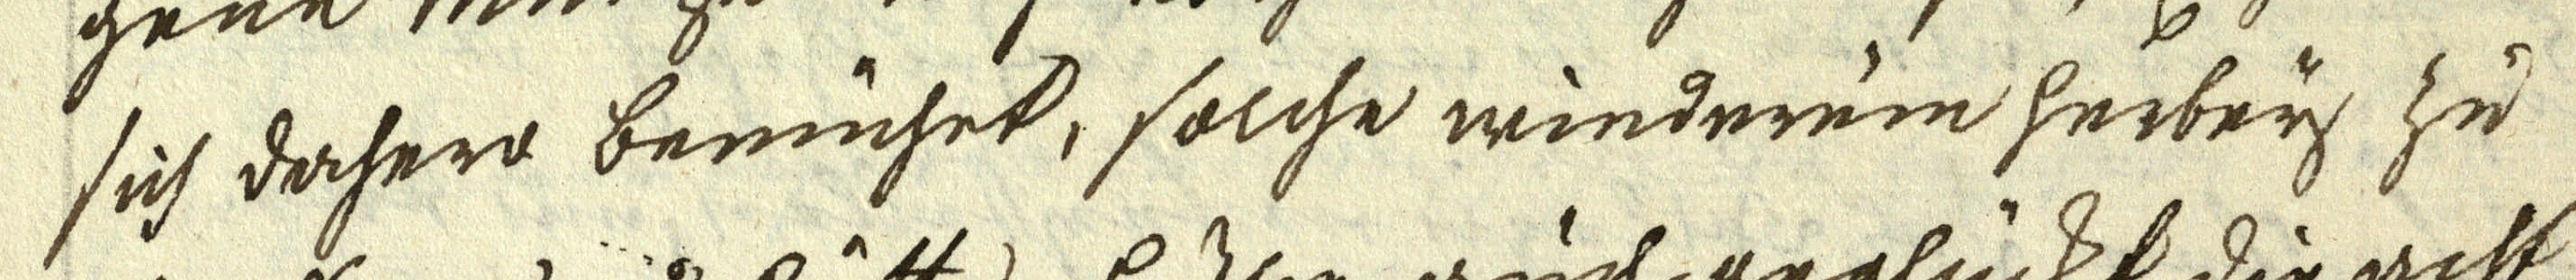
sich dahero bemühet, solche wiederum herbeÿ zu
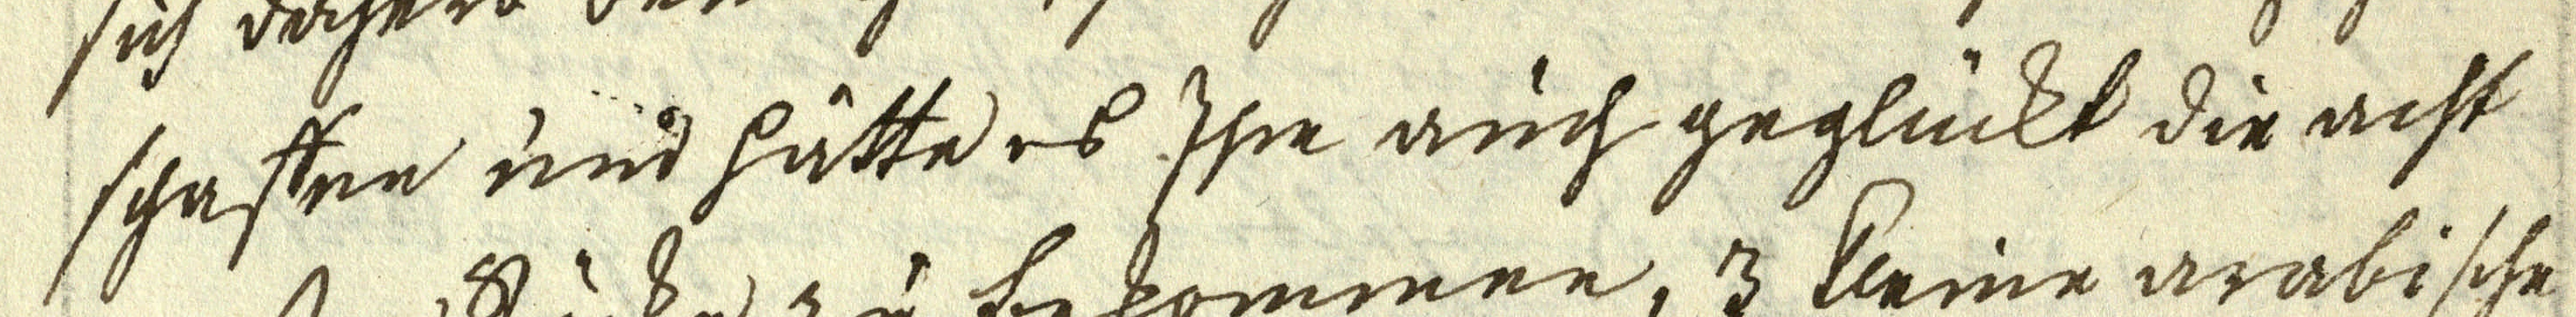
schaffen und hätte es Ihm auch geglückt die acht
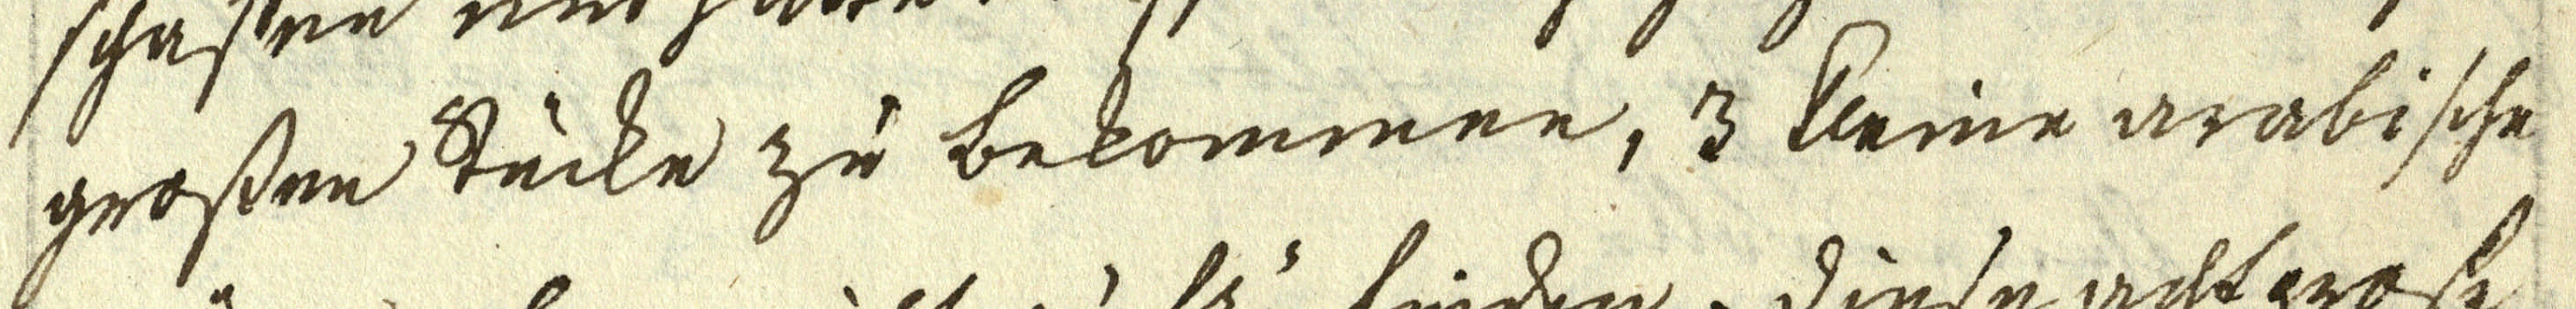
großen Stücke zu bekommen, 3 kleine arabische
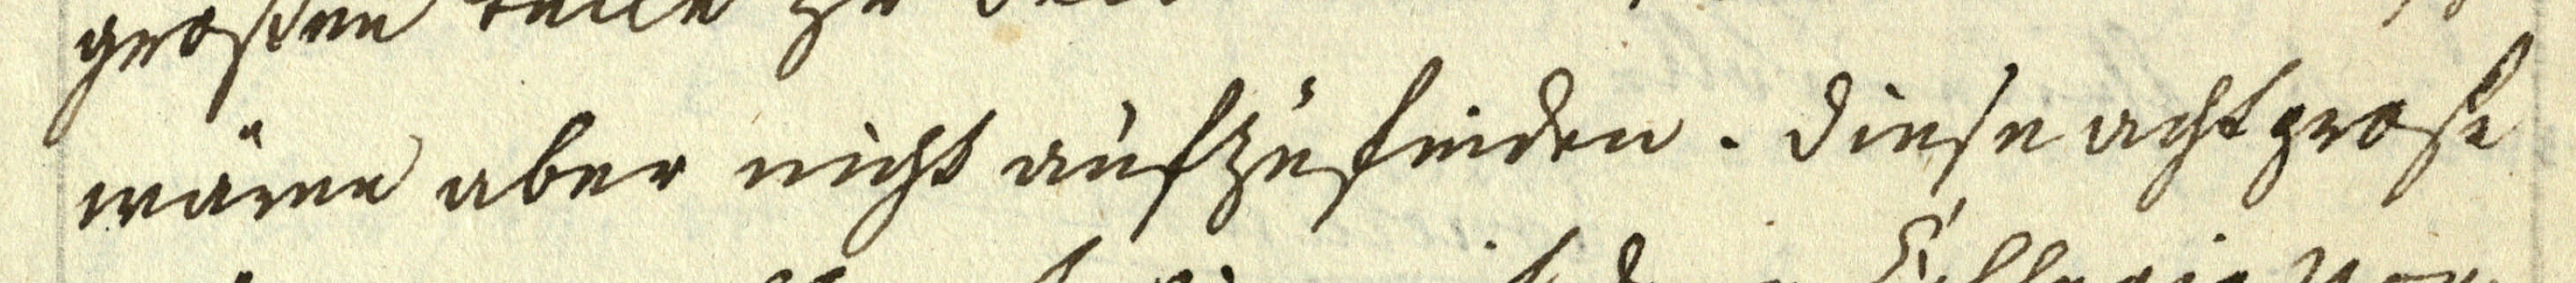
wären aber nicht aufzufinden. diese acht große
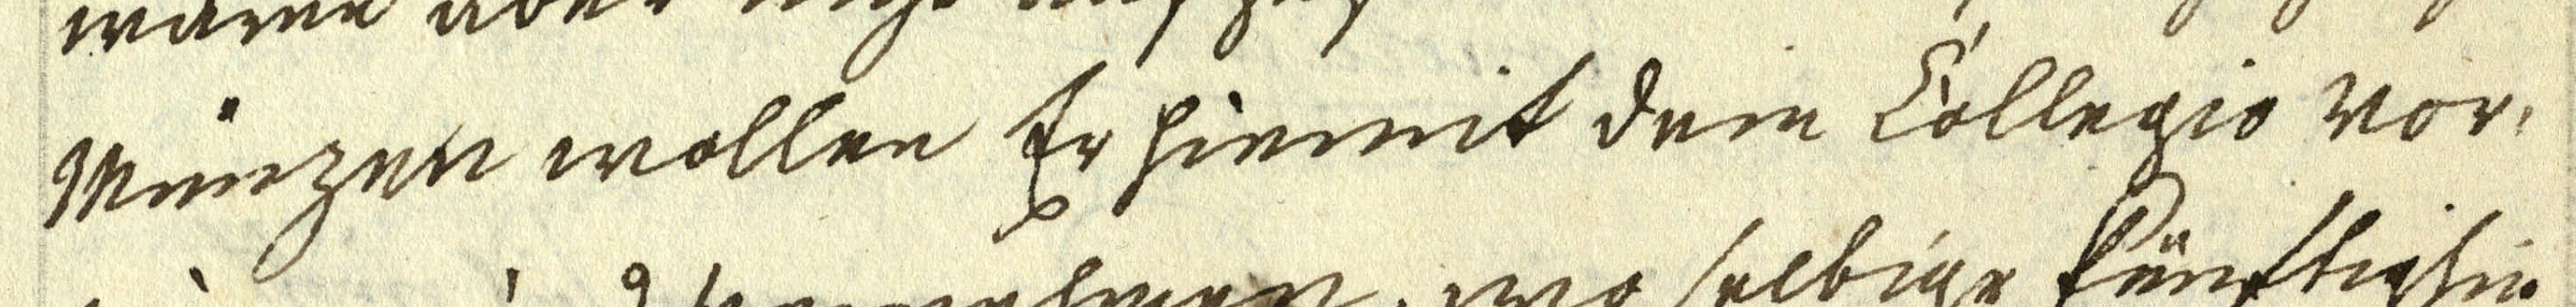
Münzen wollen Er hiemit dem Collegio vor¬
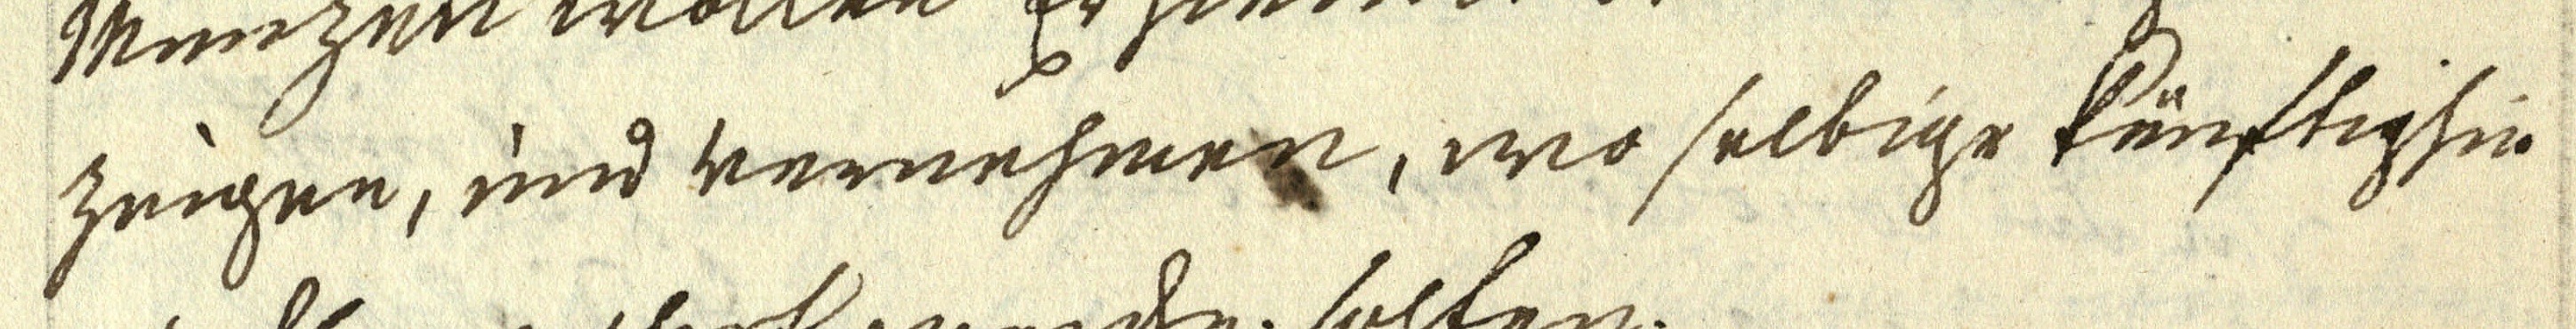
zeigen, und vernehmen, wo selbige künftighin
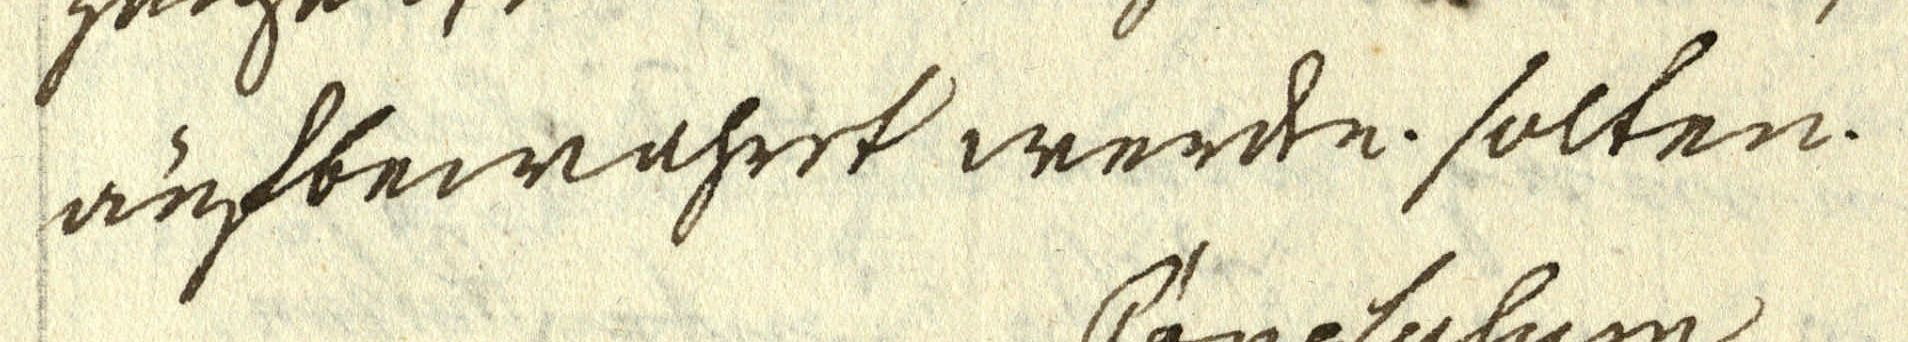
aufbewahret werden solten.
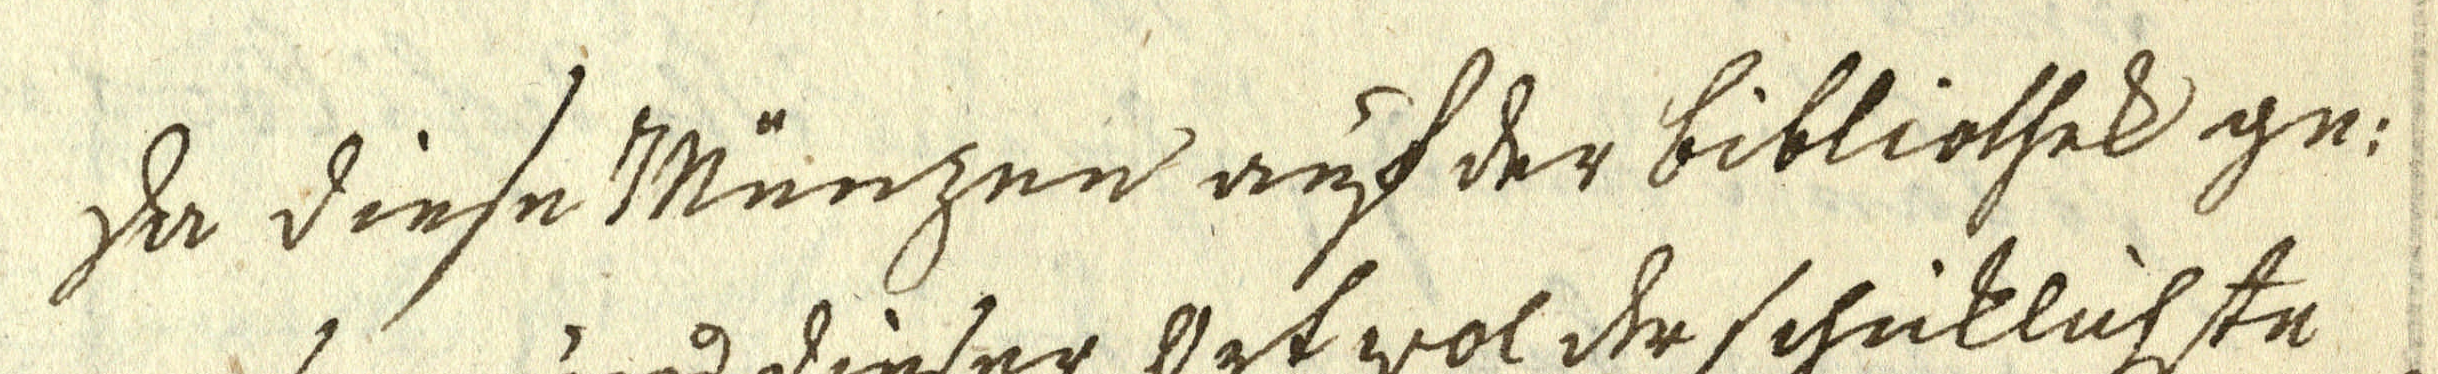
Da diese Münzen auf der Bibliothek ge¬
